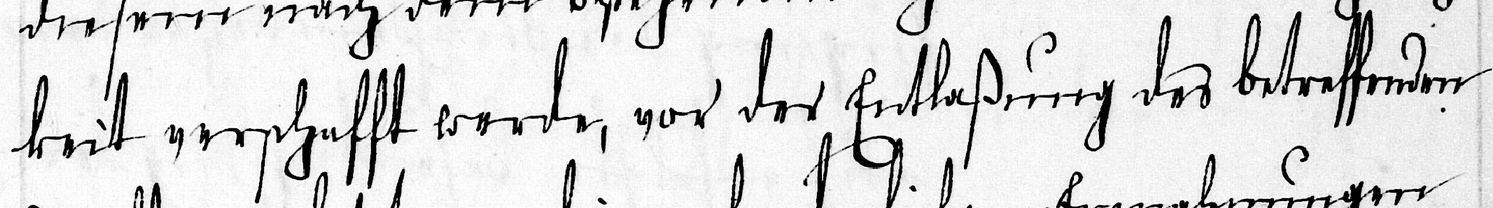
keit verschafft werde, vor der Entlaßung des betreffenden
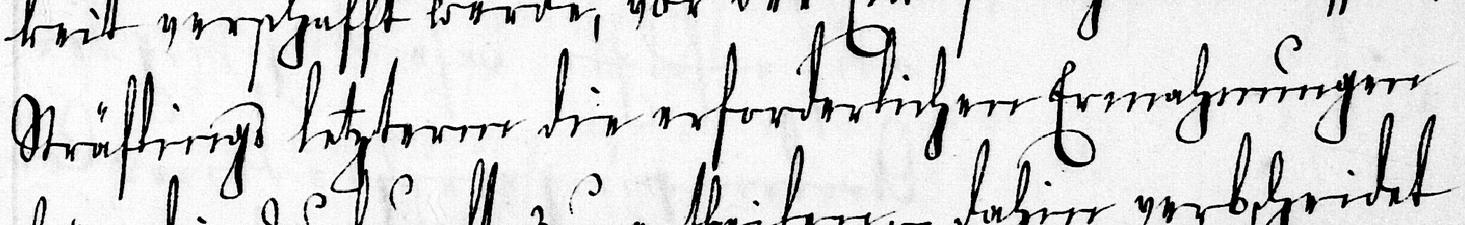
Sträflings letzterm die erforderlichen Ermahnungen
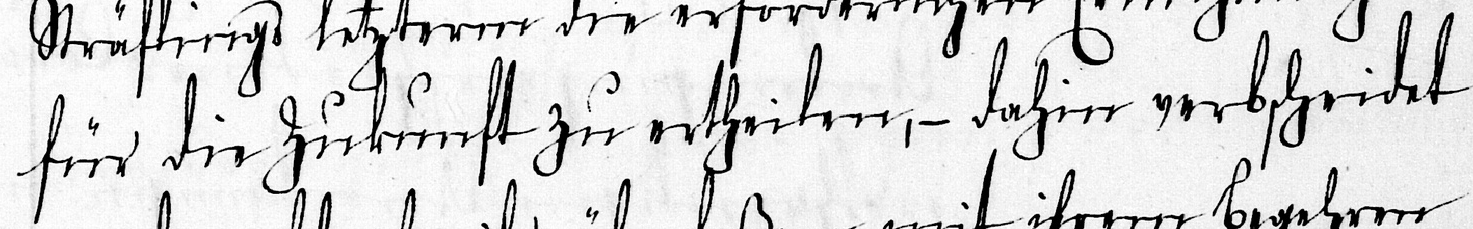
für die Zukunft zu ertheilen, – dahin verbscheidet
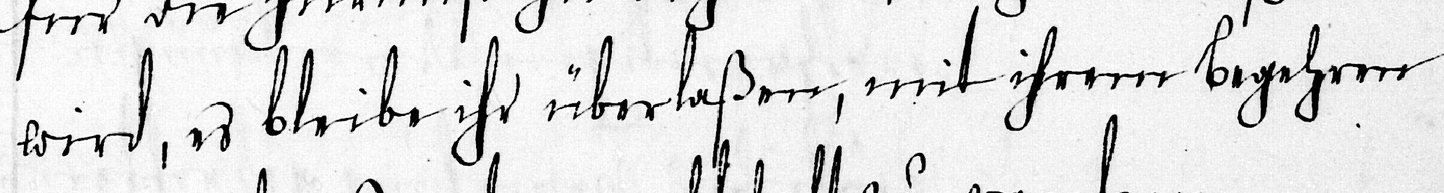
wird, es bleibe ihr überlaßen, mit ihrem Begehren
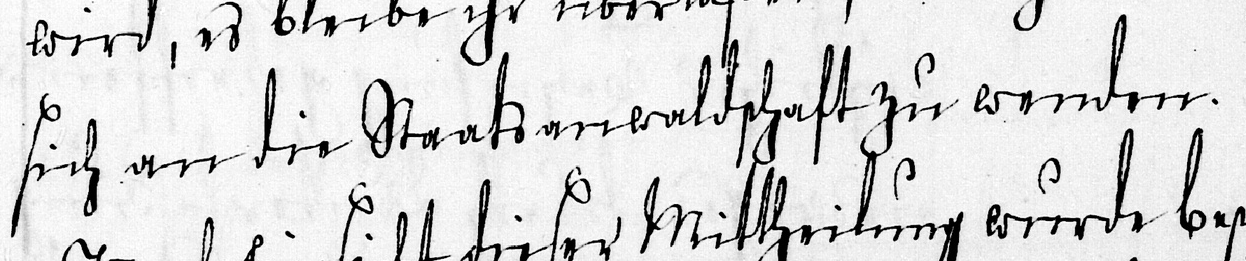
sich an die Staatsanwaldschaft zu wenden.
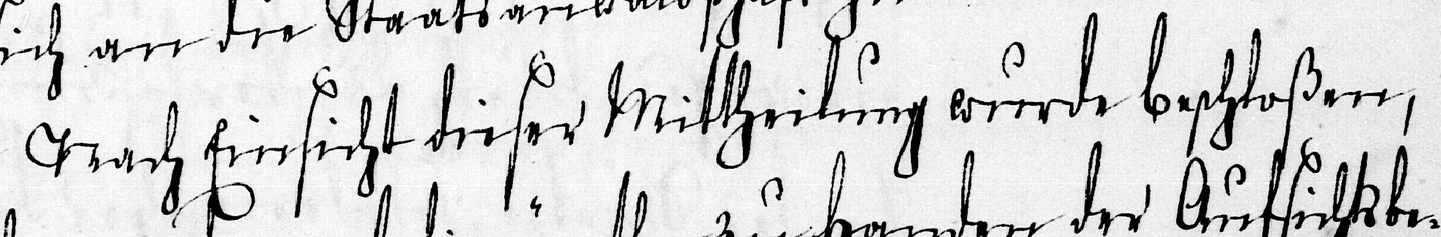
Nach Einsicht dieser Mittheilung wurde beschloßen,
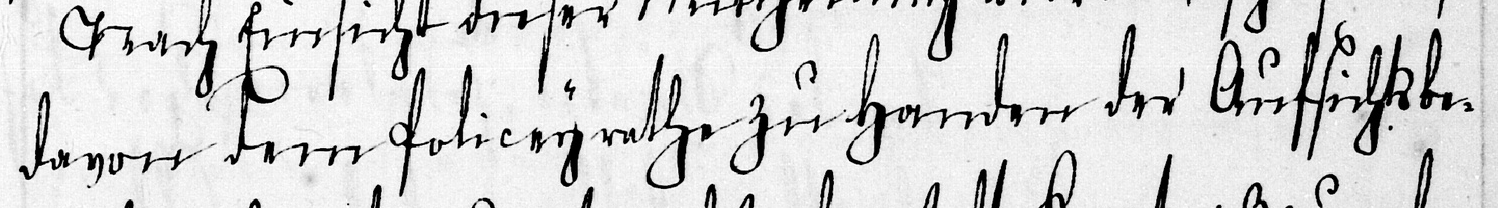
davon dem Policeyrathe zu Handen der Aufsichtsbe¬
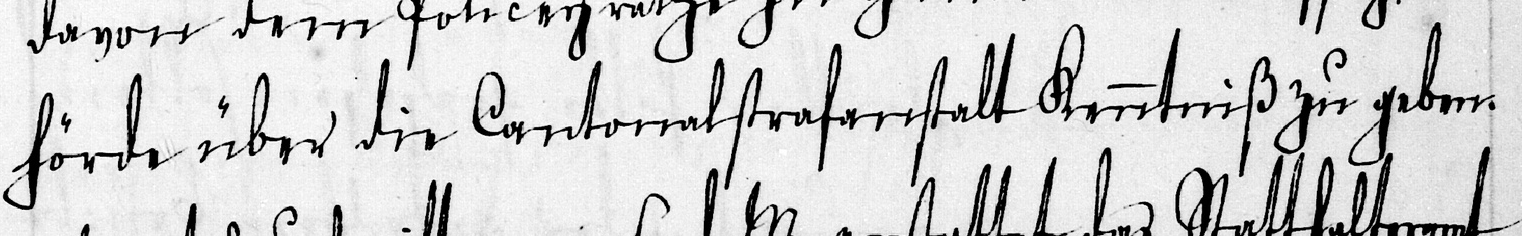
hörde über die Cantonalstrafanstalt Kenntniß zu geben.
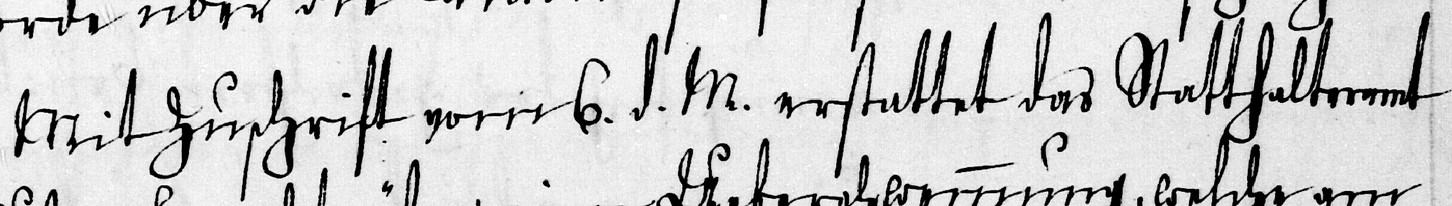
Mit Zuschrift vom 6. d. M. erstattet das Statthalteramt
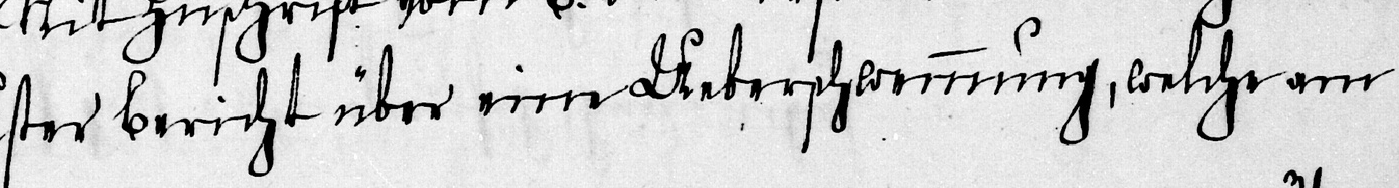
ster Bericht über eine Ueberschwemmung, welche am
